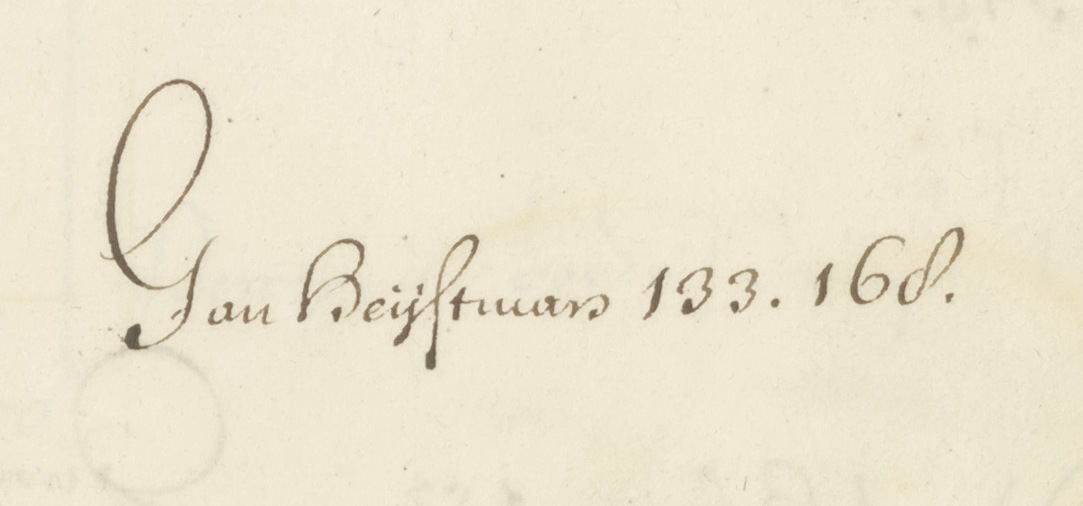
Jan Heijstman 133. 168.
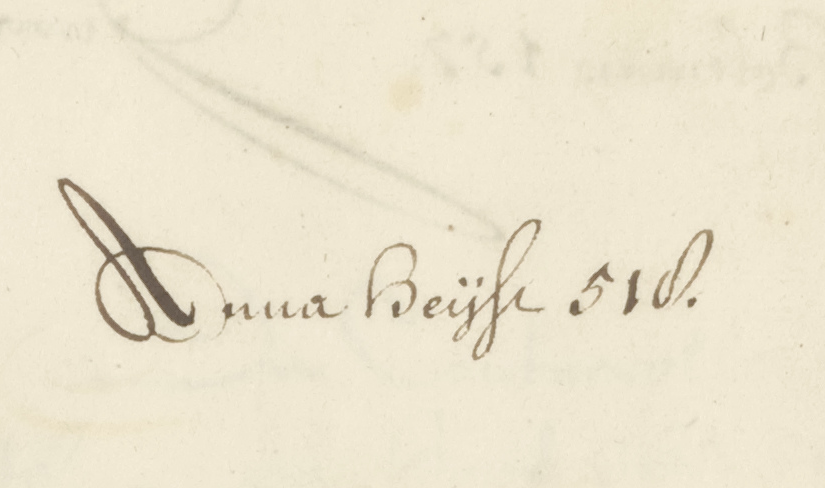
Anna Heijst 518.
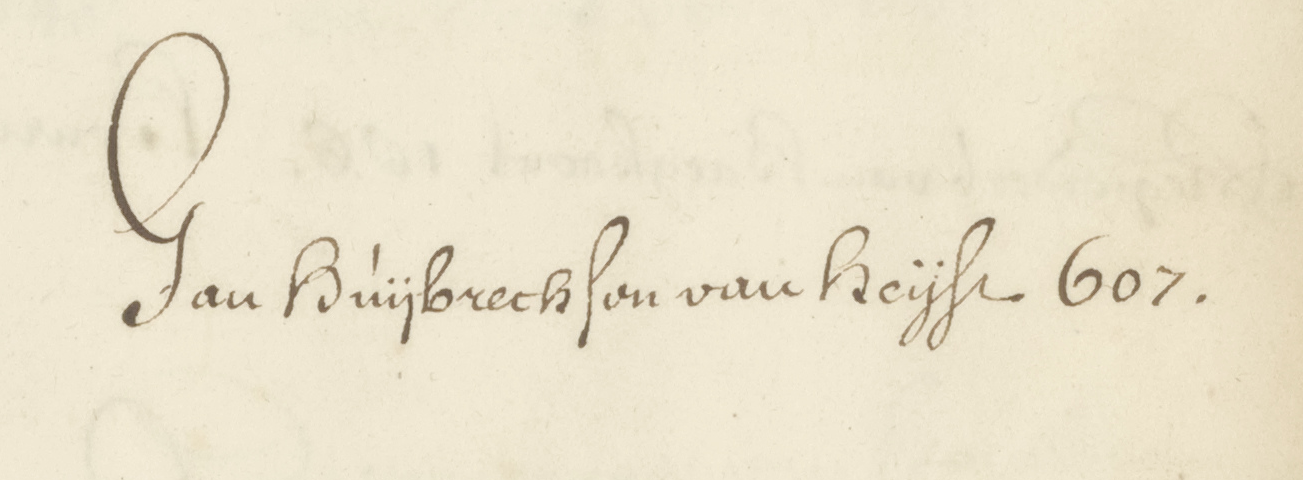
Jan Huijbrechsen van Heijst 607.
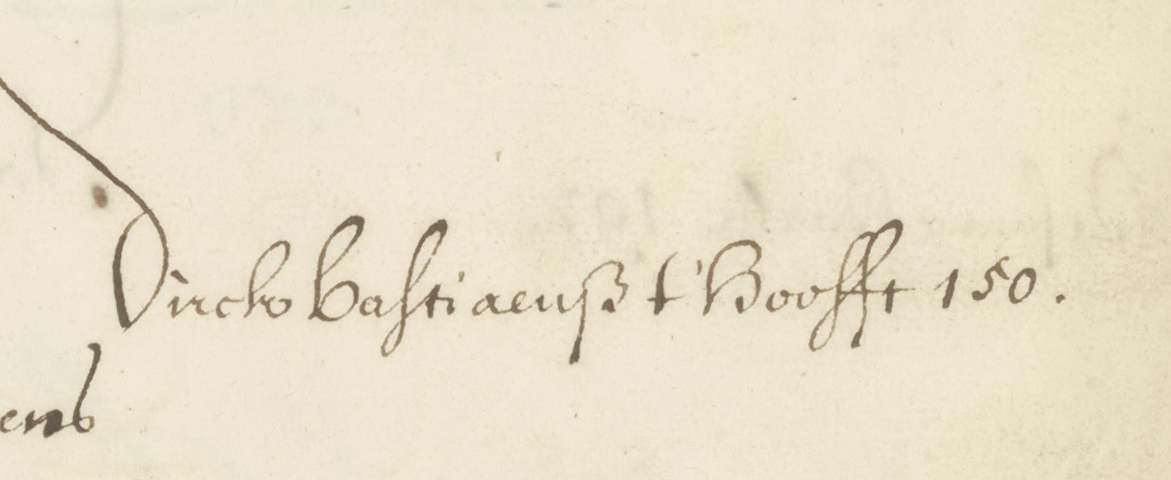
Dirck Bastiaens t‛Hoofft 150.
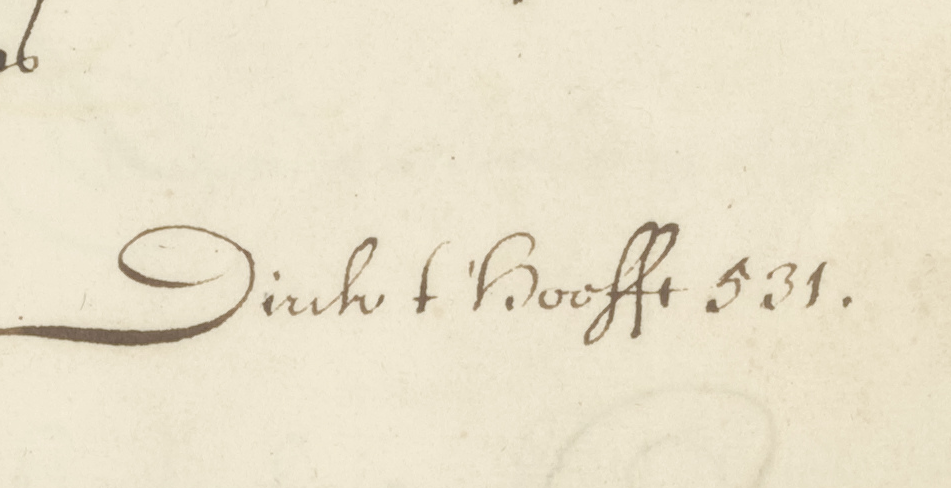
Dirk t‛ Hoofft 531.
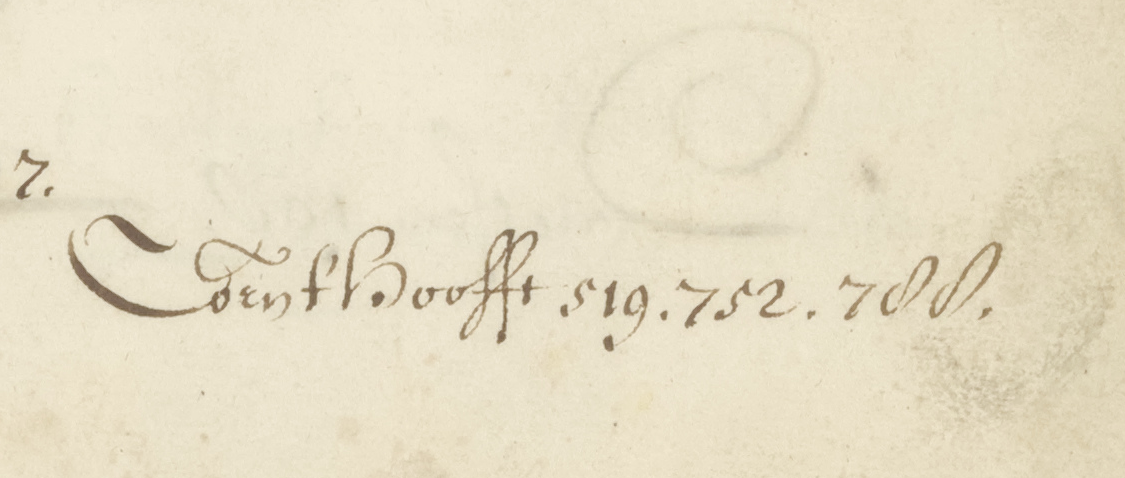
Corn t‛ Hoofft 519. 752. 788.
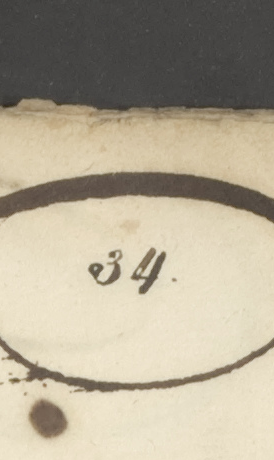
34.
